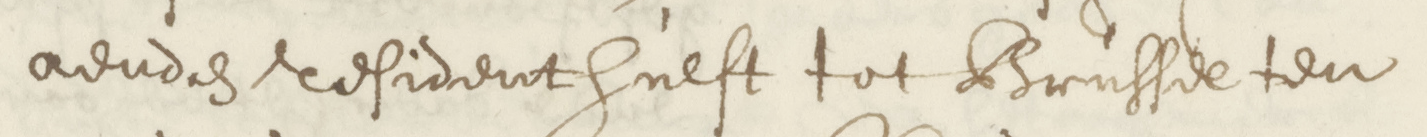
aenden resident Hulst tot Brussel ten
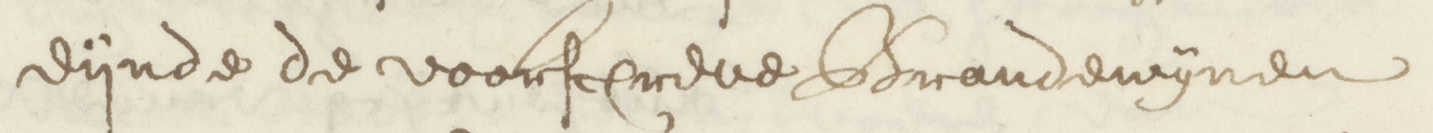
eijnde de voorschreve Brandewijnen
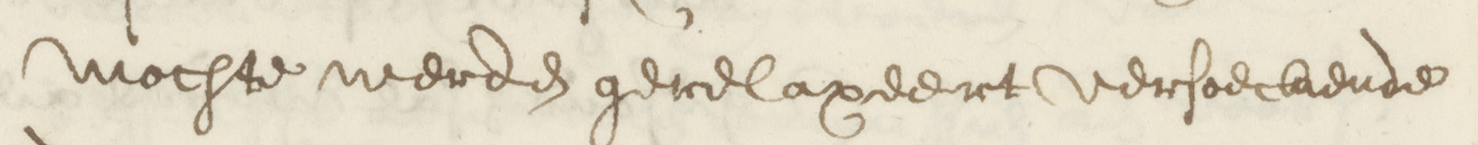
mochte werden gerelaxeert versoeckende
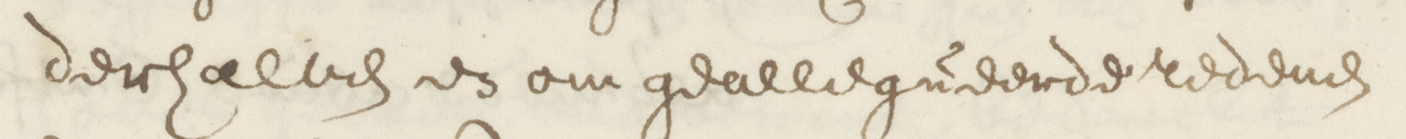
derhalven en om geallegueerde redenen
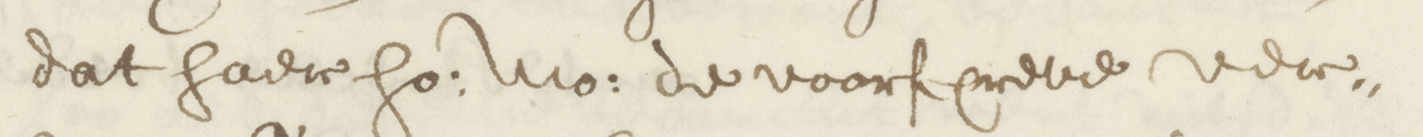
dat haer ho:Mo: de voorschreve ver„
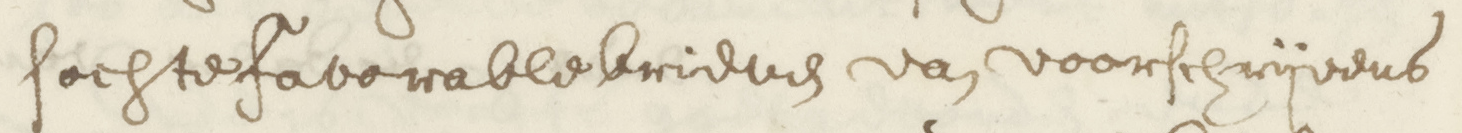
sochte favorable brieven van voorschrijvens
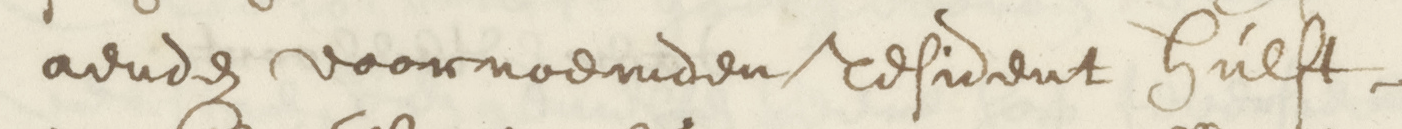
aenden voornoemden resident Hulst
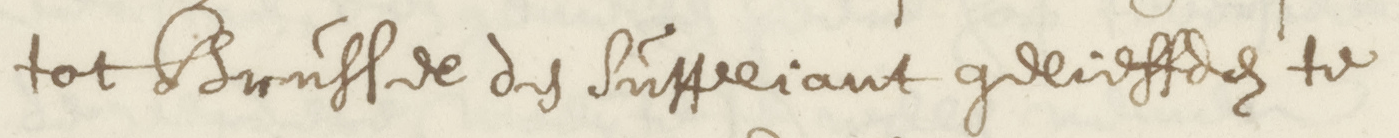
tot Brussel den Suppliant gelieffden te
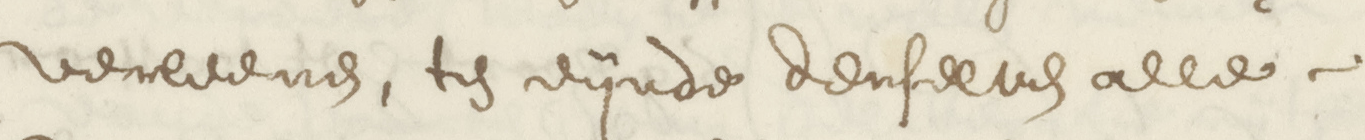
verleenen, ten eijnde denselven alle
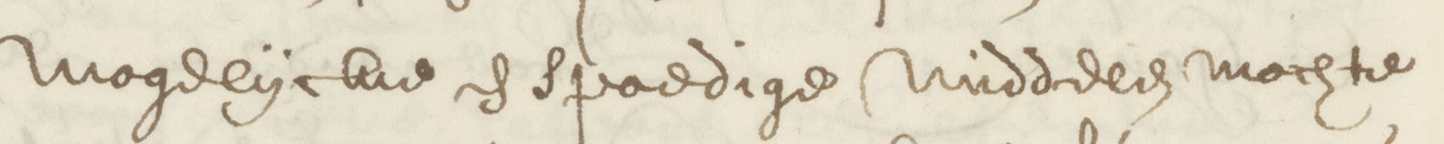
mogelijcke & spoedige middelen mochte
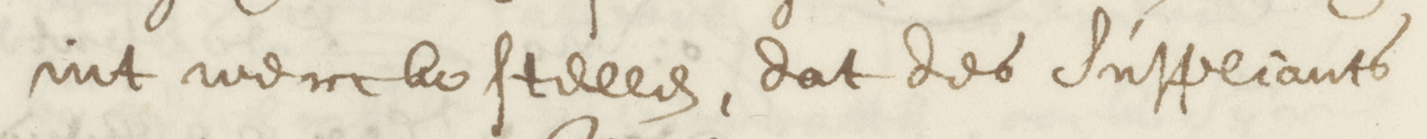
int werck stellen, dat des Suppliants
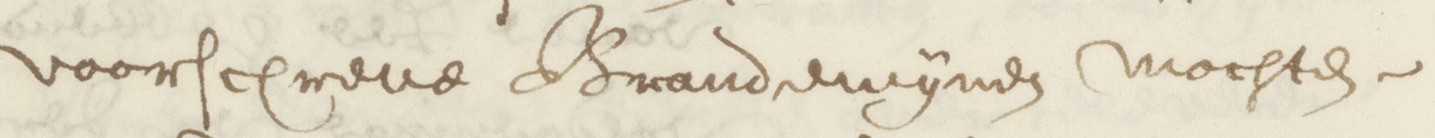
voorschreve Brandewijnen mochten
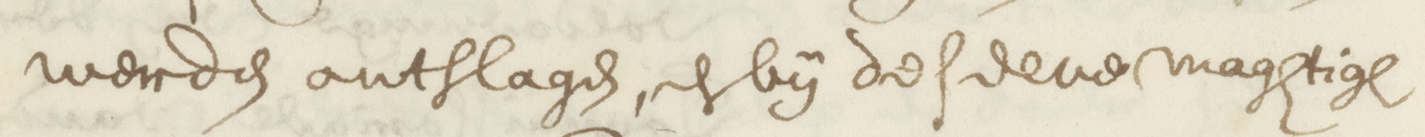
werden ontslagen, en bij deselve maghtigh
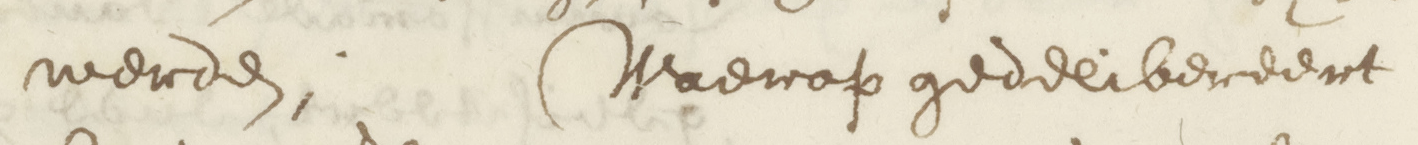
werden; Waerop gedelibereert
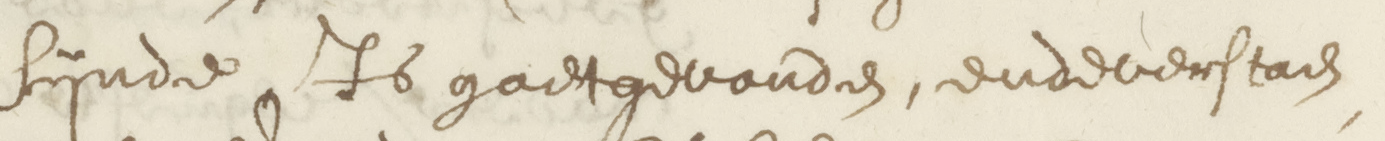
sijnde, is goetgevonden, ende verstaen
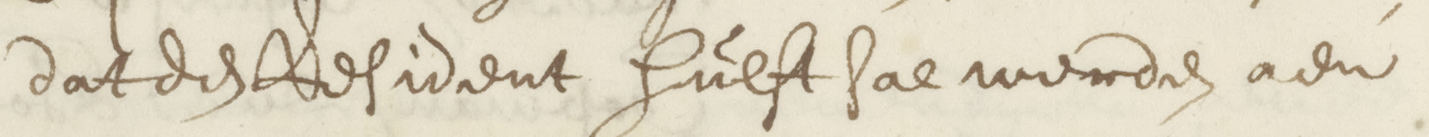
dat den Resident Hulst sal werden aen
